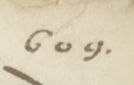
609.
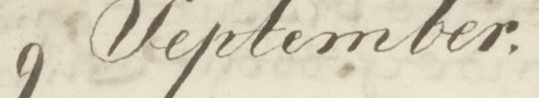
9 September.
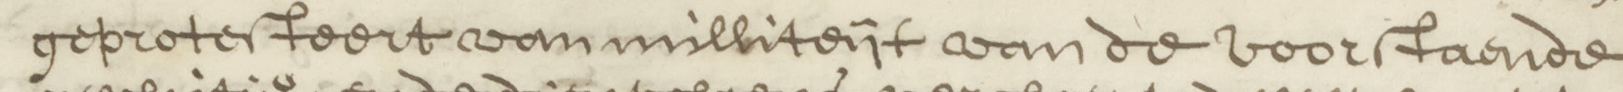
geprotesteert van milliteijt van de voorstaende
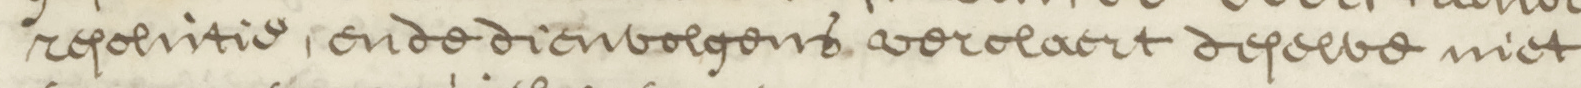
resolutie, ende dienvolgens verclaert deselve niet
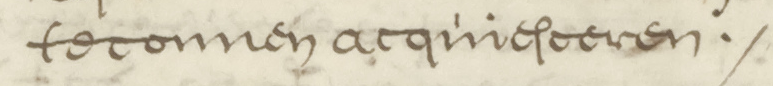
te connen acquieseeren.
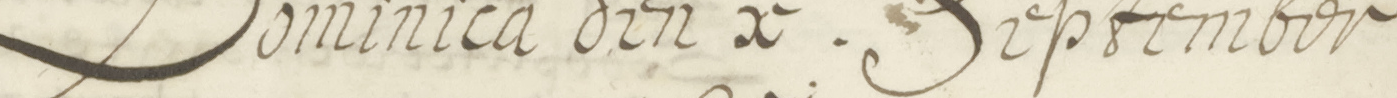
Dominica den xe. September
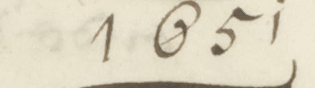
1651
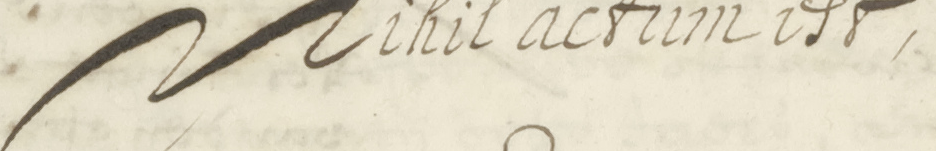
Nihil actum est,
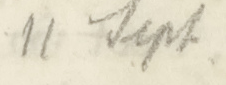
11 Sept
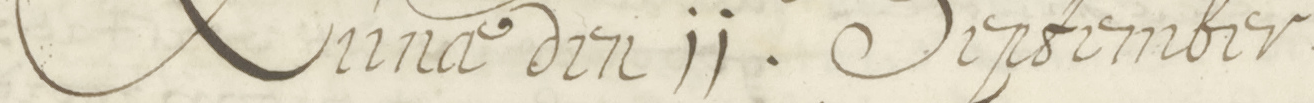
Luna den iie. September
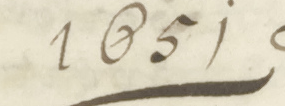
1651.
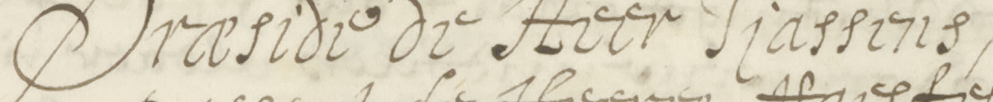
Præside de Heer Tjassens,
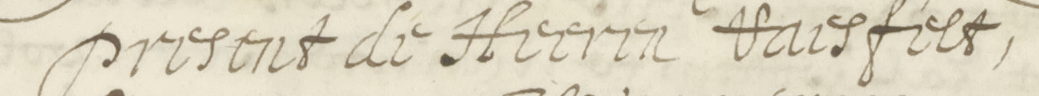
present de Heeren Raesfelt,
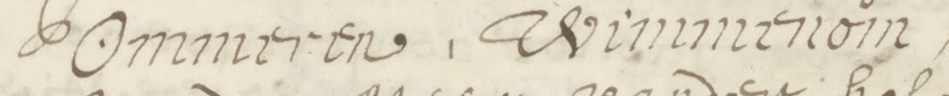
Ommeren, Wimmenom,
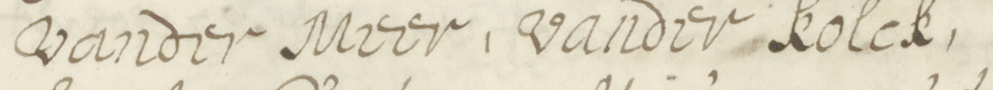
vander Meer, vander Kolck,
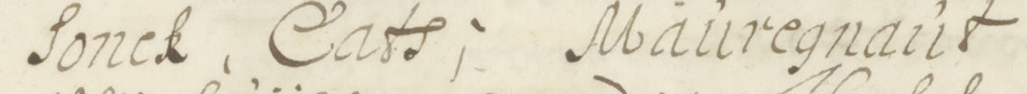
Sonck, Cats, Mauregnaut
